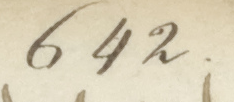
642.
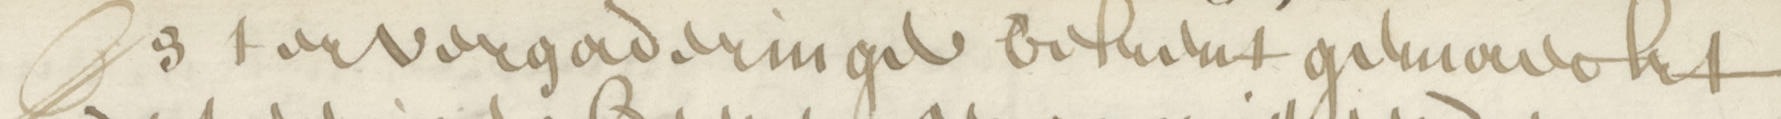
Is ter vergaderinge bekent gemaeckt
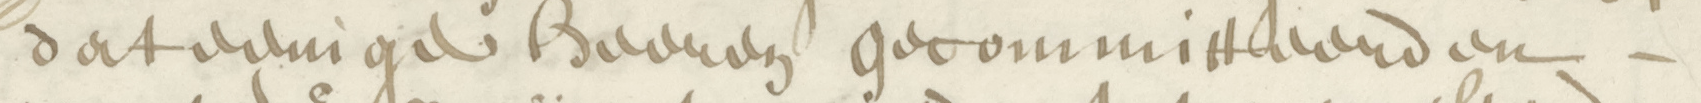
dat eenige heeren gecommitteerden -
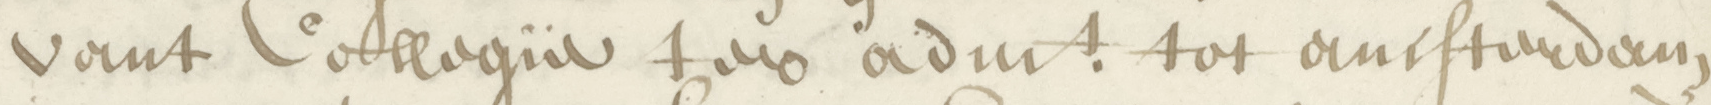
vant Collegie ter admt. tot Amsterdam,
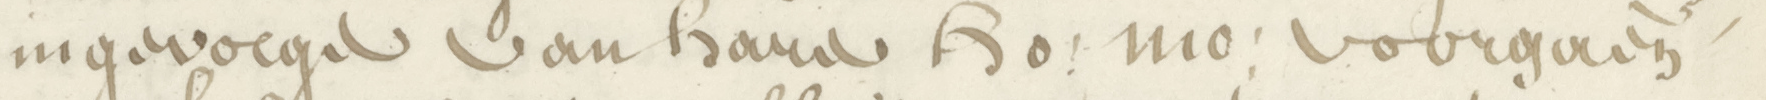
ingevolge van hare Ho:Mo: voorgaen
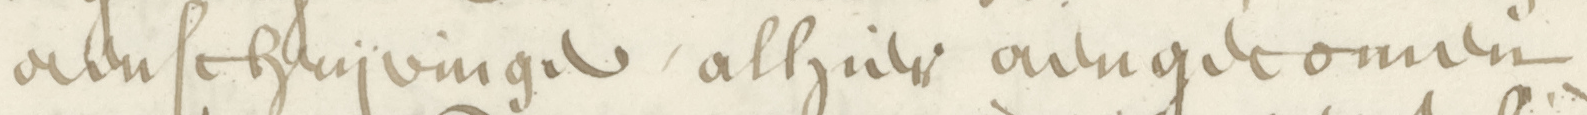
aenschrijvinge, alhier aengecomen
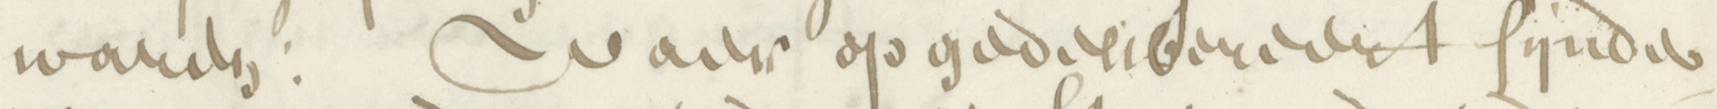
waren: Waer op gedelibereert sijnde,
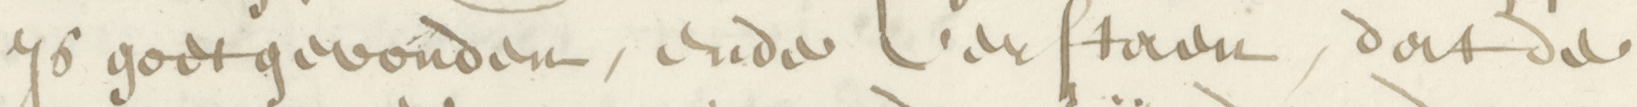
Is goetgevonden, ende verstaen, dat de
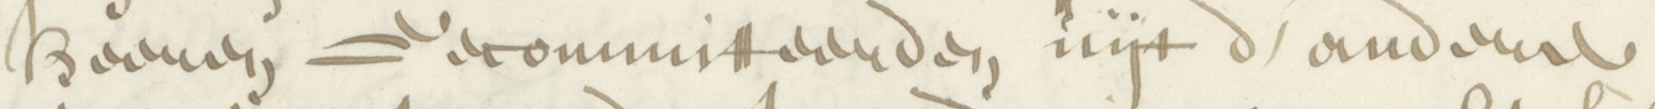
Heeren Gecommitteerden uijt d'andere
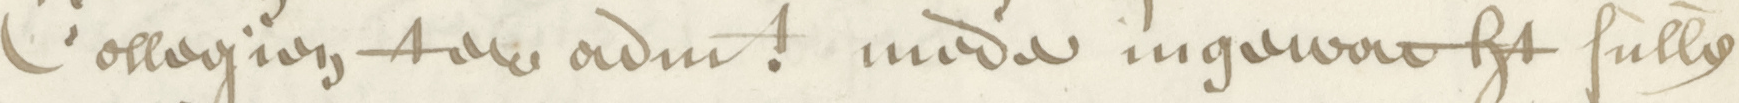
Collegien ter admt. mede ingewacht sullen
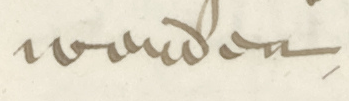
werden.
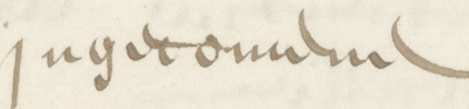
ingecomene
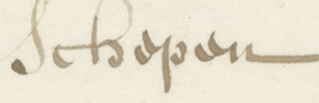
Schepen
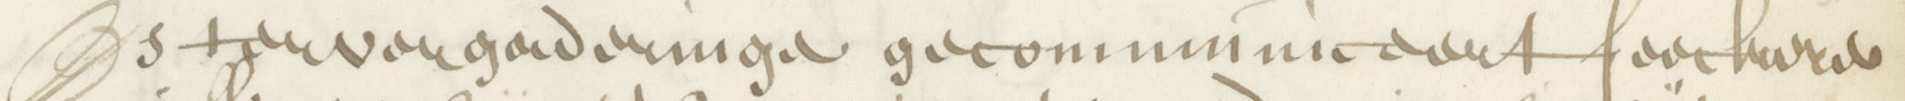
Is ter vergaderinge gecommuniceert seeckere
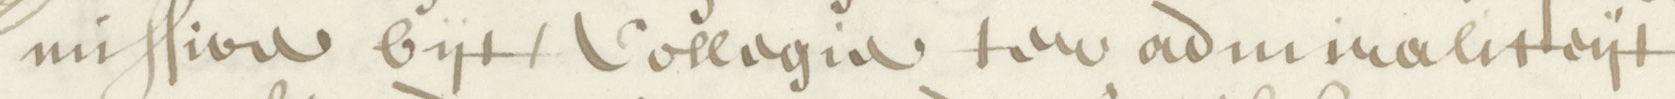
missive bijt' Collegie ter admiraliteijt
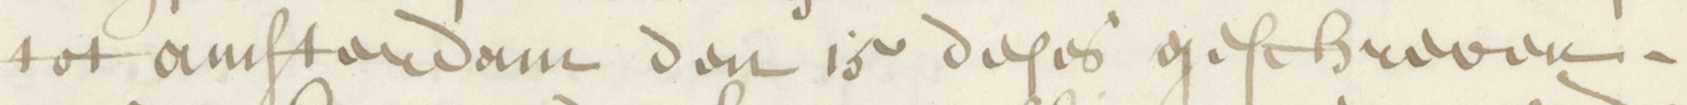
tot amsterdam den 15 deses geschreven
